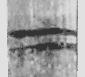二
